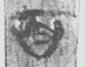百
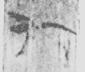九
